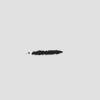一
